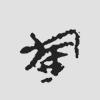軍
